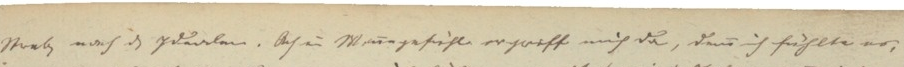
Streben nach den Idealen. Ach ein Wonnegefühl ergriff mich da, denn ich fühlte es,
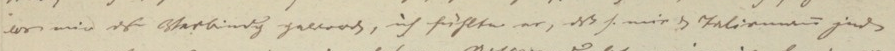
ws mir ds Verbindung geworden, ich fühlte es, dß s. mir den Talismann jeder
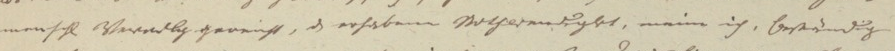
menschl. Veredlung gereicht, die erhabene Nothwendigkeit, meine ich, beständig
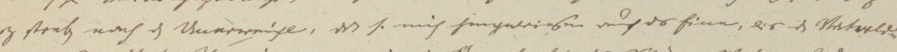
z. streben nach dem Unerreichl., dß s. mich hingewiesen auf ds Eine, ws dem Vaterland
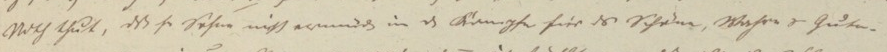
Noth thut, dß s. Söhne nicht ermüden in dem Kampfe für ds Schöne, Wahre & Gute.
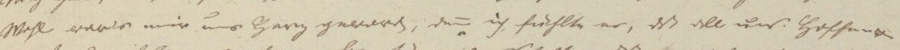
Wohl war's mir ums Herz geworden, denn ich fühlte es, dß all uns. Hoffen &
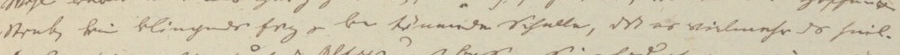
Streben kein klingendes Erz & ke tönende Schelle, dß es vielmehr ds heil.
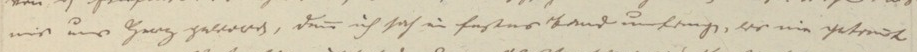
mir ums Herz geworden, denn ich sah ein festes Band umfangen, ws nie getrennt
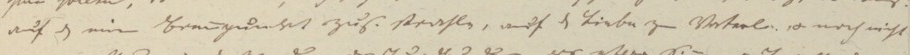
auf den einen Brennpunkt zus. strahlen, auf die Liebe zum Vaterl., & noch nicht
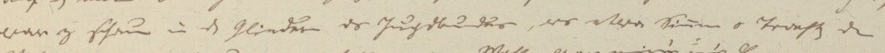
war z schauen in den Gliedern ds Jugdbundes, ws etwa Sinnen & Trachten dem
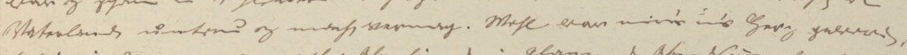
Vaterland untreu z machen vermag. Wohl war mir's um's Herz geworden, –
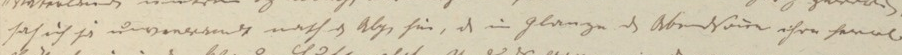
sah ich ja unverwandt nach den Alpen hin, die im Glanze der Abendsonne ihre herrl.
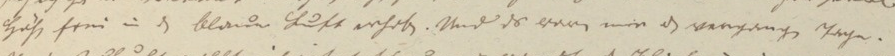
Höhen frei in die blaue Luft erhoben. Und ds waren mir die vergangnen Tage.
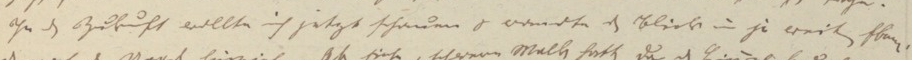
In die Zukunft wollte ich jetzt schauen & wandte den Blick in j. weiten Ebenen,
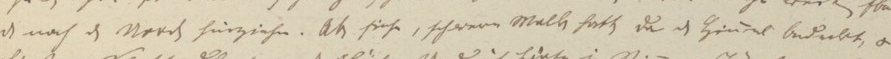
die nach dem Norden hinziehen. Aber siehe, schwere Wolken hatten da den Himmel bedeckt, &
